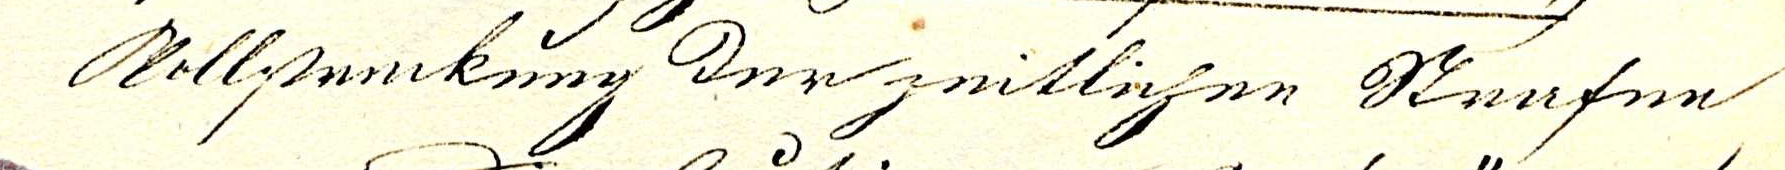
Vollstreckung der zeitlichen Strafen
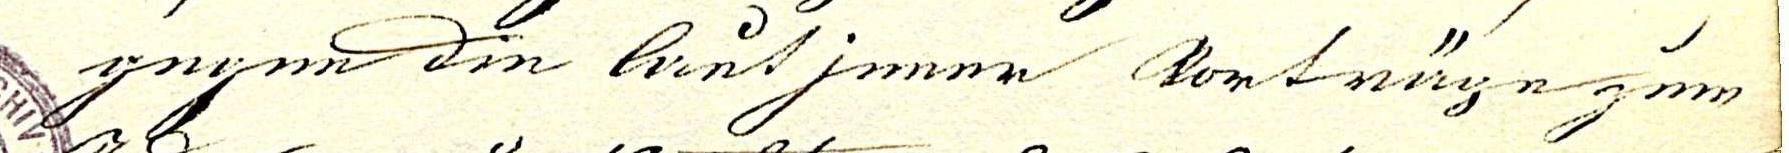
gegen die laut jener Vorträge zum
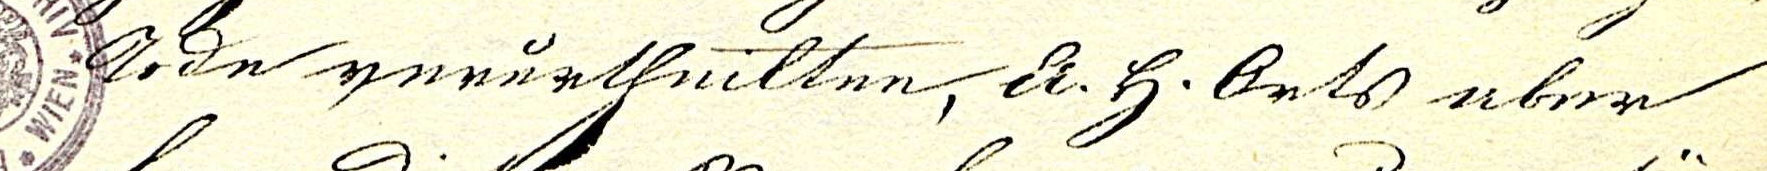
Tode verurtheilten, A. H. Orts aber
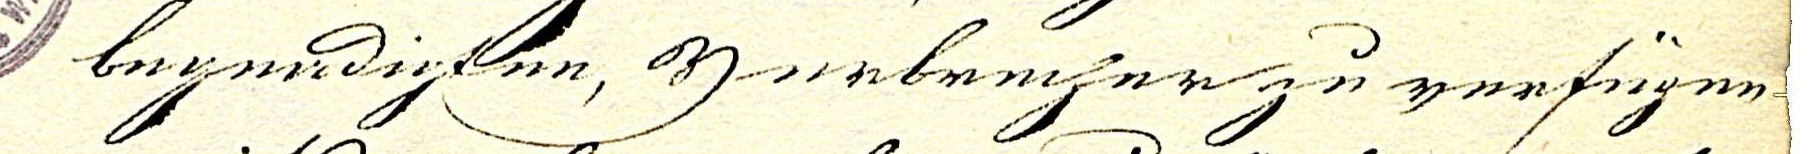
begnadigten, Verbrecher zu verfügen
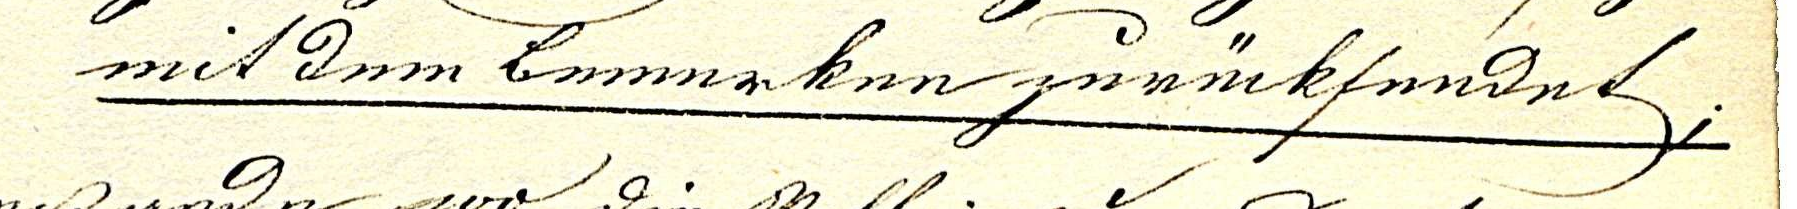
mit dem Bemerken zurücksendet;
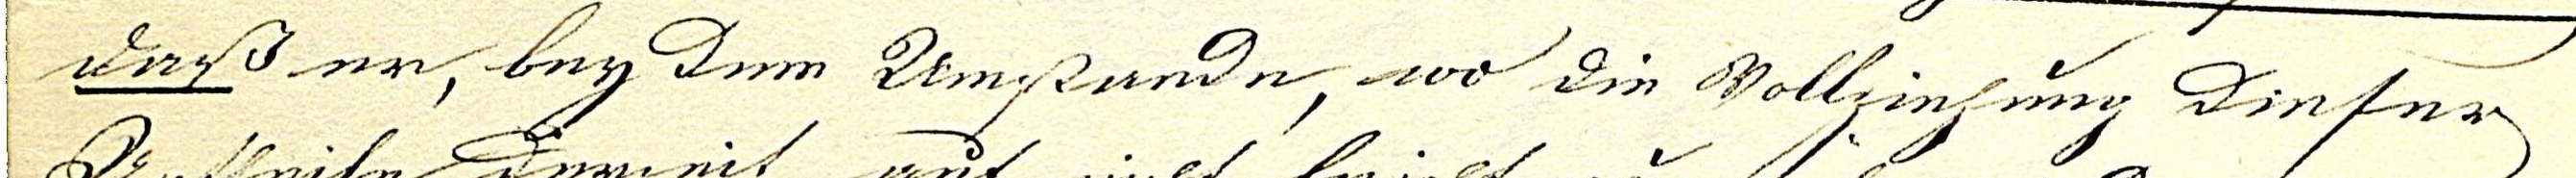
daß er, bey dem Umstande, wo die Vollziehung dieser
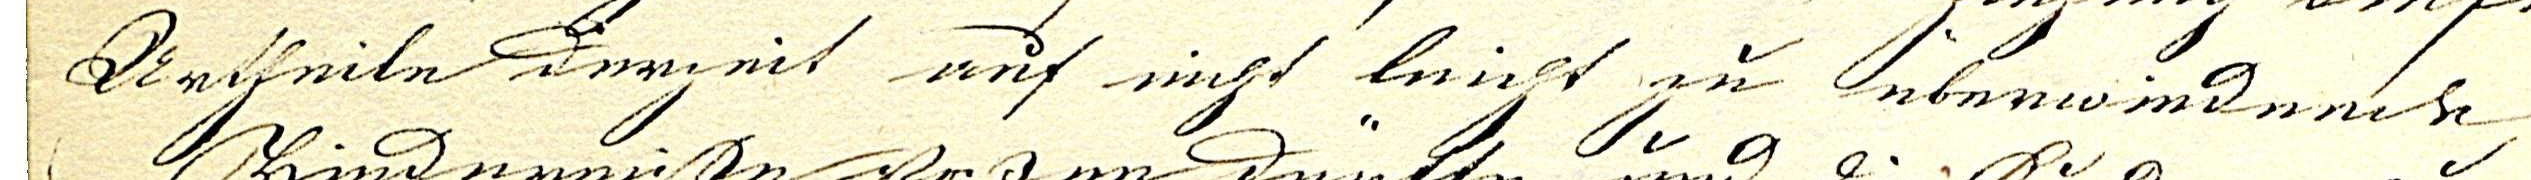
Urtheile derzeit auf nicht leicht zu überwindende
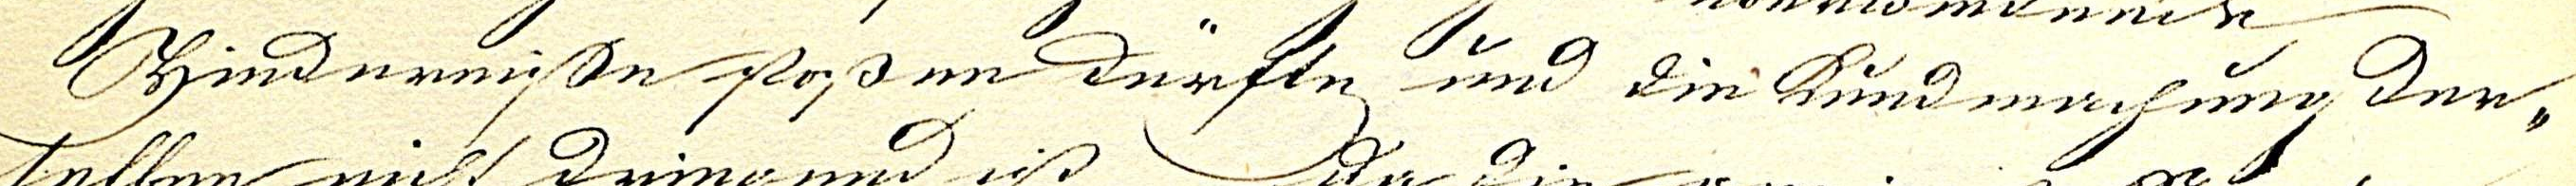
Windereiße stoßen dürfte und die Kundmachung der¬
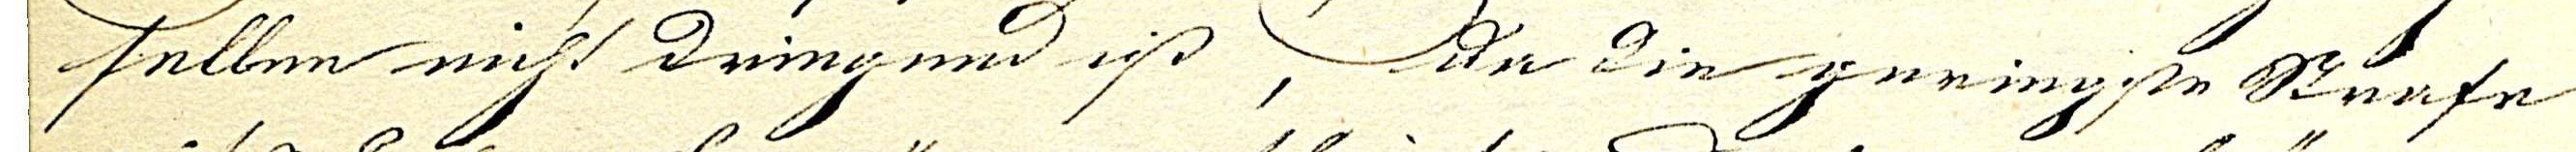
selben nicht dringend ist, da die geringste Strafe
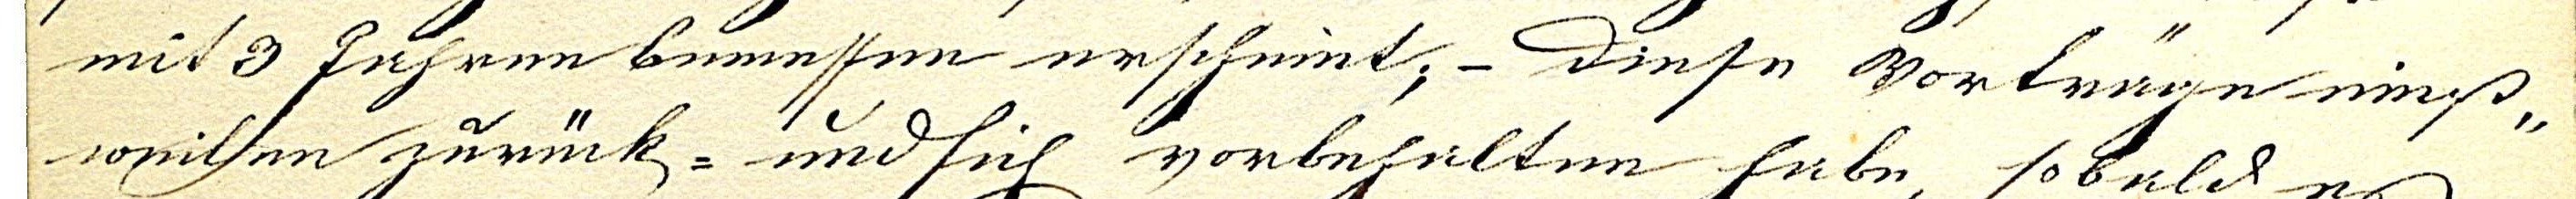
mit 3 Jahren bemessen erscheint;- diese Vorträge einst¬
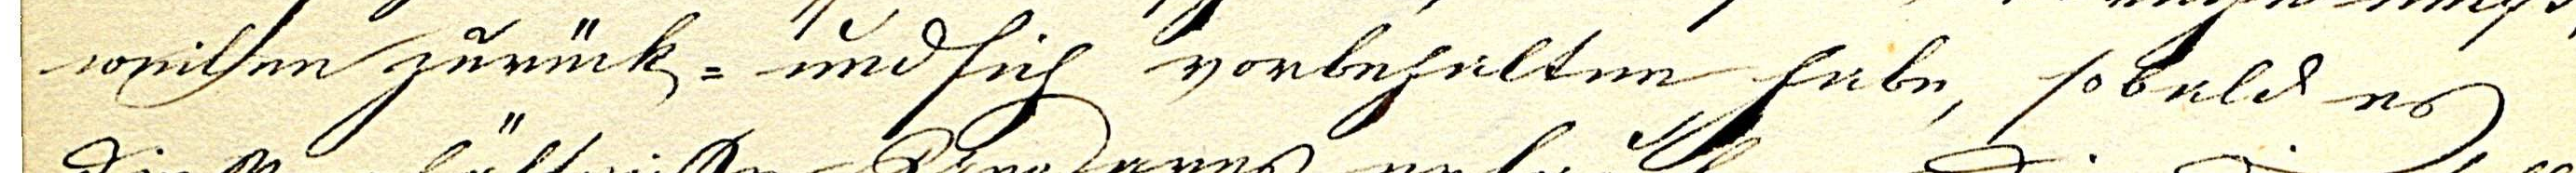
weilen zurück- und sich vorbehalten habe, sobald es
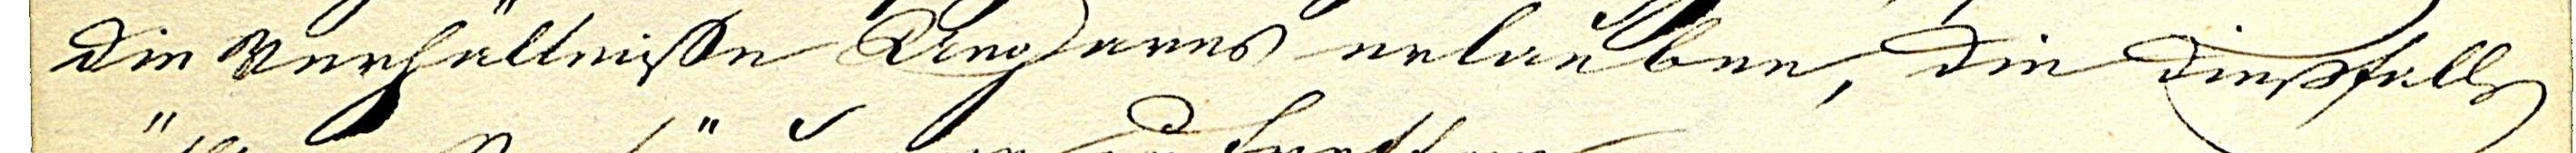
die Verhältniße Ungares erlauben, die dießfalls
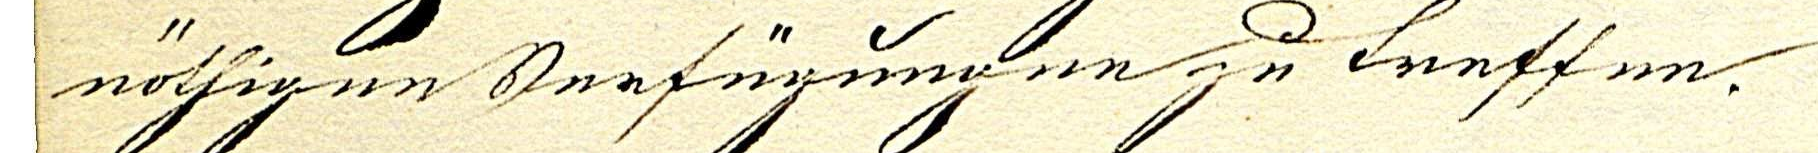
nöthigen Verfügungen zu treffen.
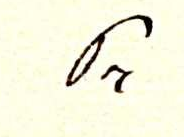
Sr
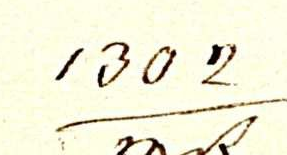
1302
